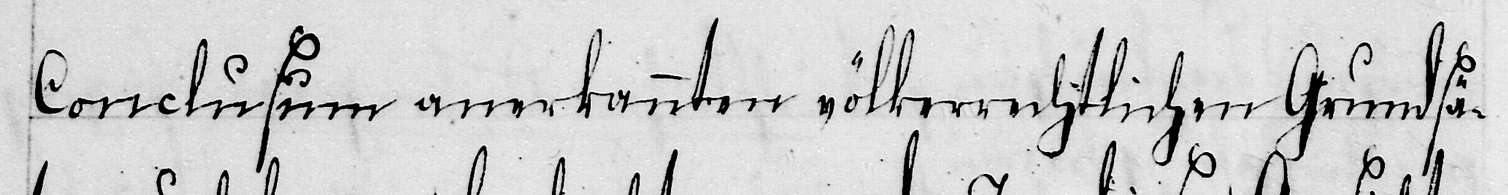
Conclusum anerkannten völkerrechtlichen Grundsä¬
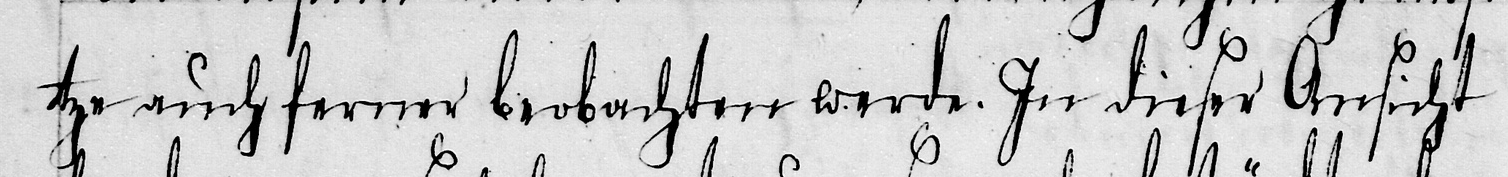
tze auch ferner beobachten werde. In dieser Ansicht
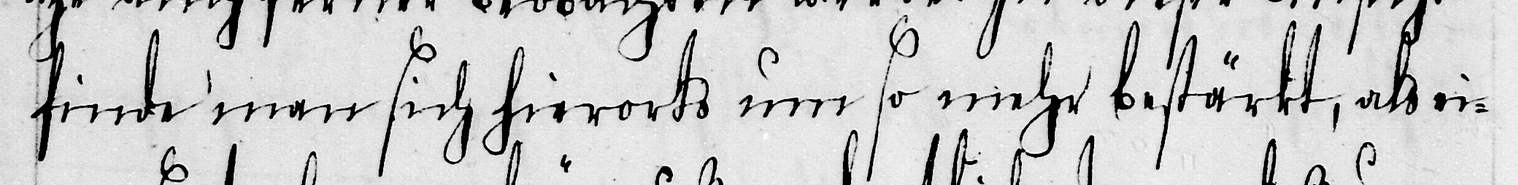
finde man sich hierorts um so mehr bestärkt, als e¬
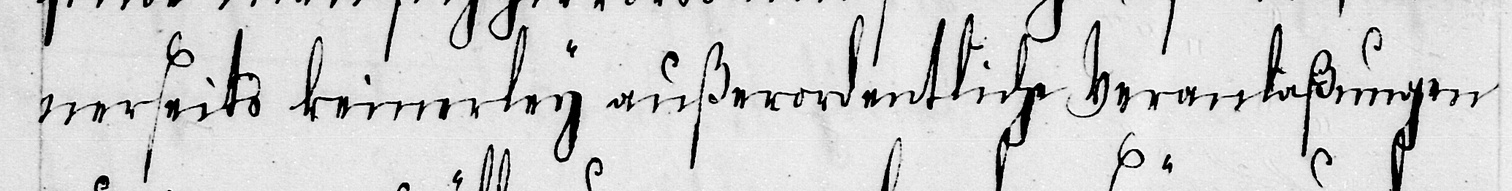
inerseits keinerley außerordentliche Veranlaßungen
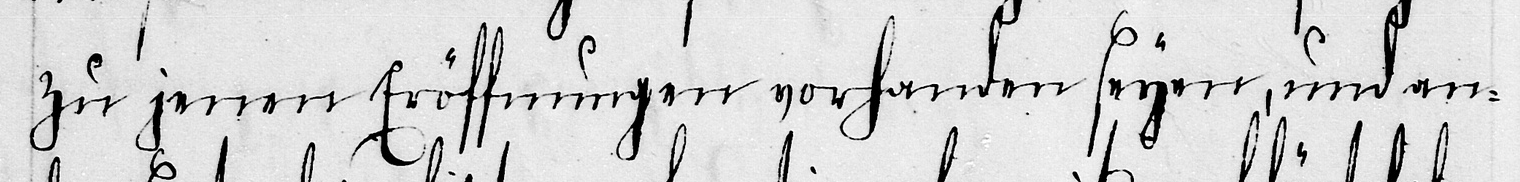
zu jenen Eröffnungen vorhanden seyen, und an¬
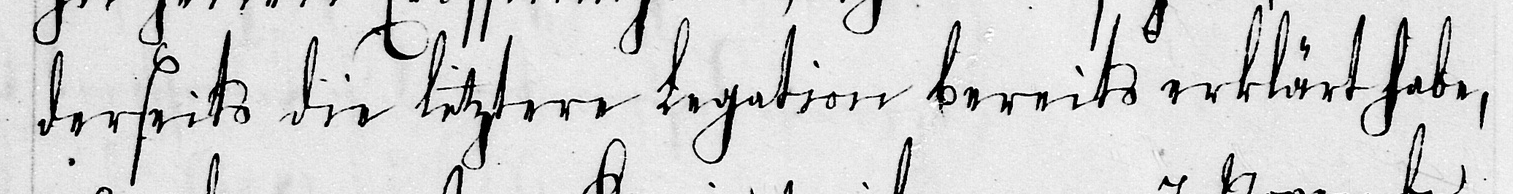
derseits die letztere Legation bereits erklärt habe,
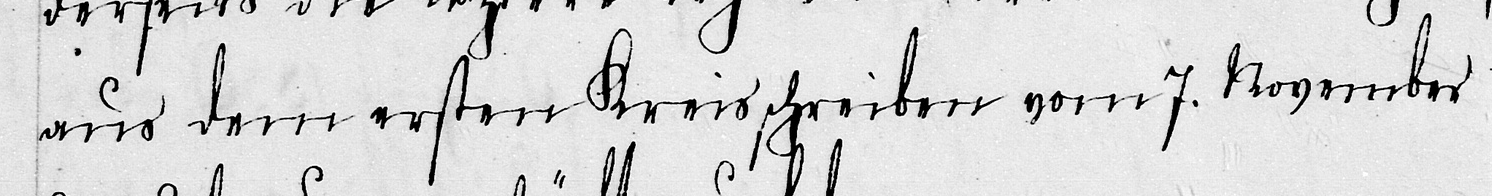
aus dem ersten Kreisschreiben vom 7. November
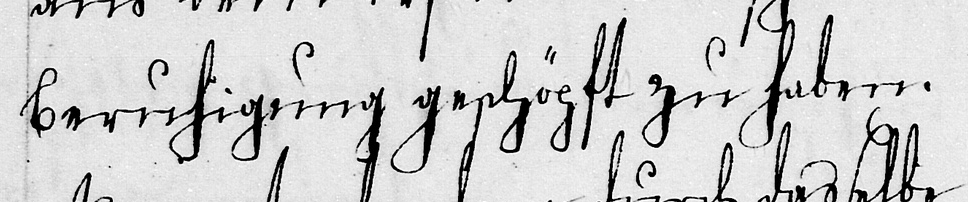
Beruhigung geschöpft zu haben.
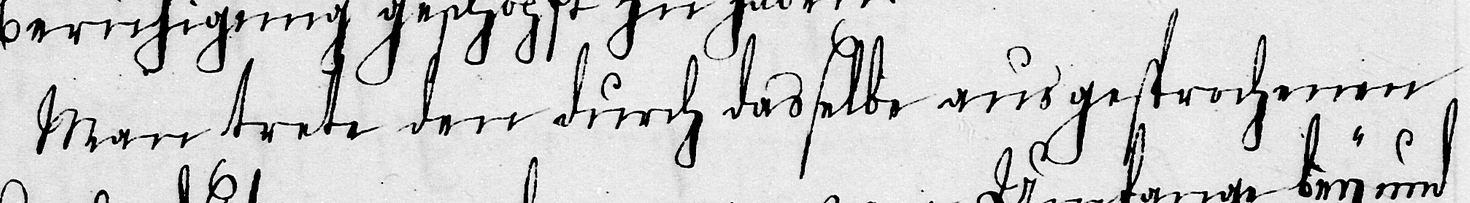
Man trete den durch dasselbe ausgesprochenen
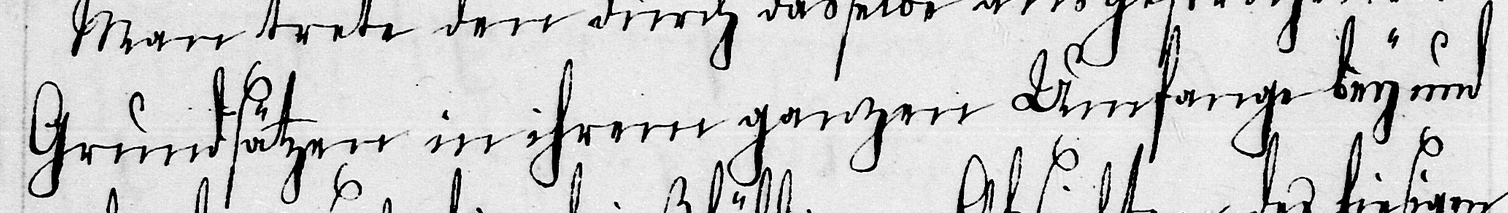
Grundsätzen in ihrem ganzen Umfange bey und
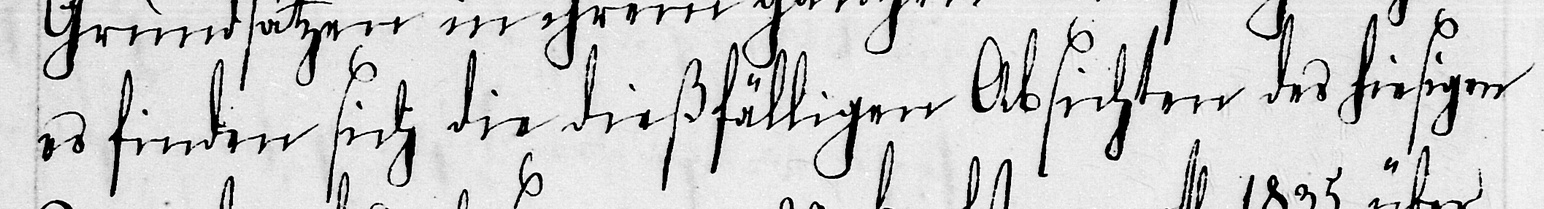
es finden sich die dießfälligen Absichten des hiesigen
